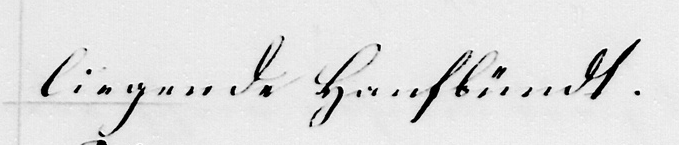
liegende Hanfbündt.
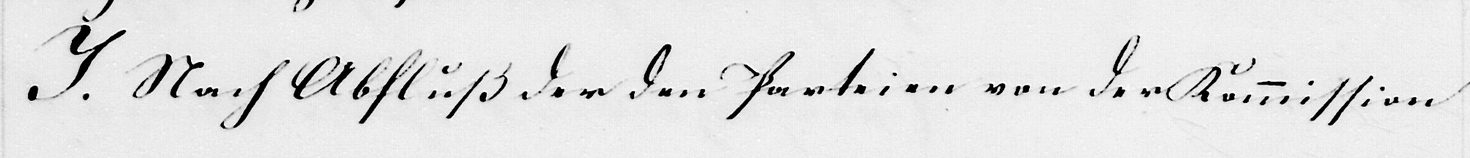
I. Nach Abfluß der den Parteien von der Kommission
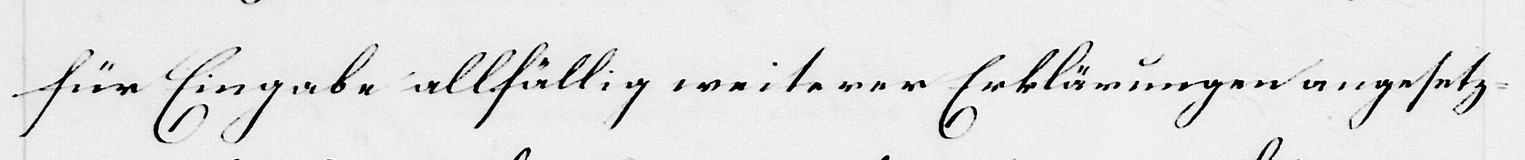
für Eingabe allfällig weiterer Erklärungen angesetz¬
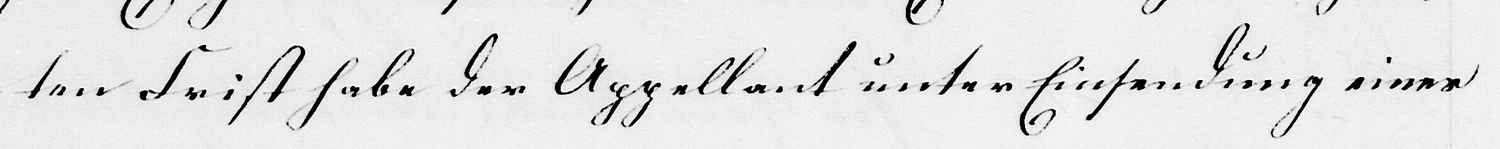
ten Frist habe der Appellant unter Einsendung eines
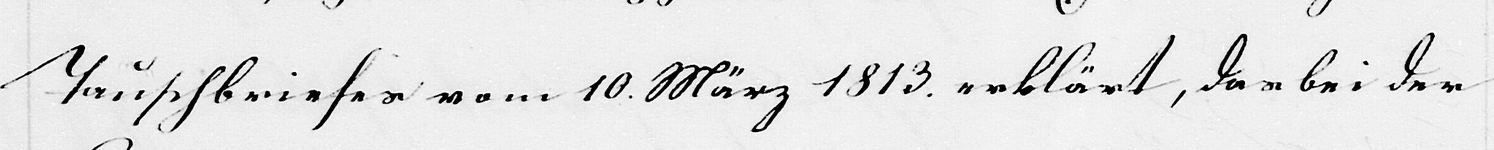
Tauschbriefes vom 10. März 1813. erklärt, das bei der
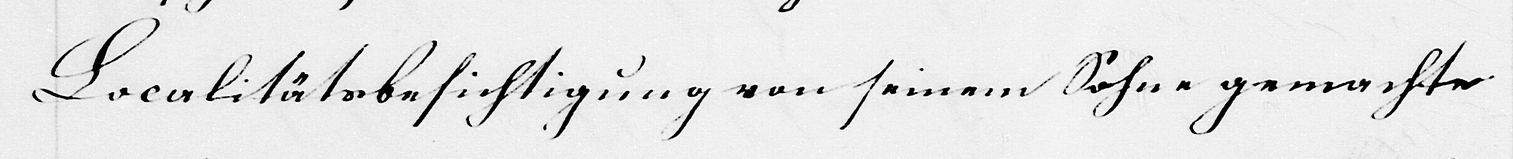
Localitätsbesichtigung von seinem Sohne gemachte
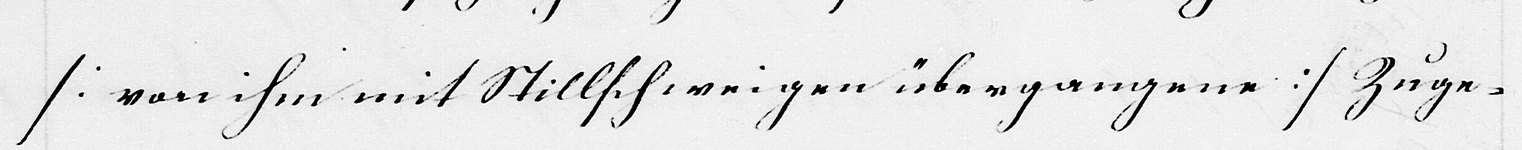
[von ihm mit Stillschweigen übergangene] Zuge¬
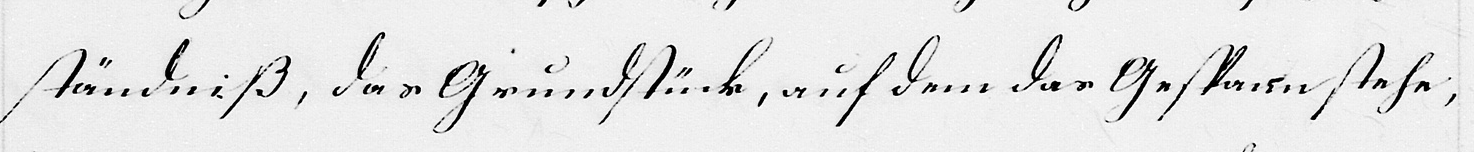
ständniß, das Grundstück, auf dem das Gespann stehe,
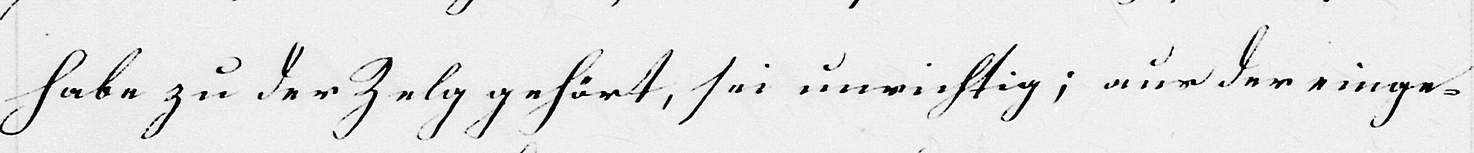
habe zu der Zelg gehört, sei unrichtig; aus der einge¬
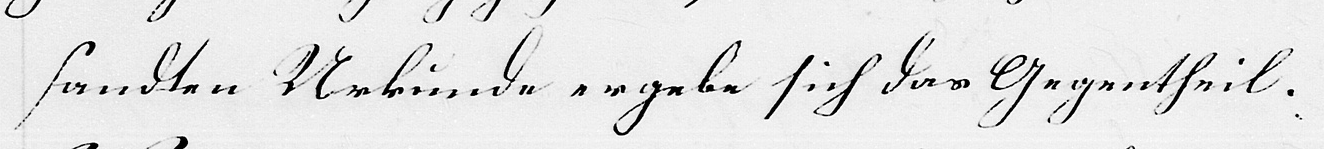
sandten Urkunde ergebe sich das Gegentheil.
